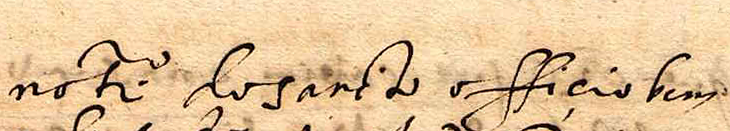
not.ro do sancto officio bem
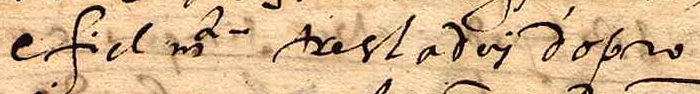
e fielmte tresladey do pro
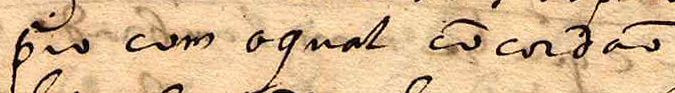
pio com o qual cōcordaõ
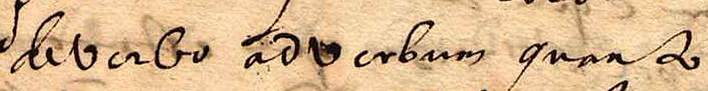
de verbo ad verbum quanto
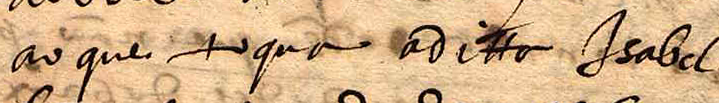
ao que toqua a ditta Jsabel
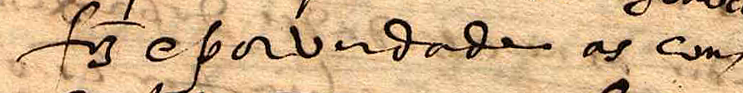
frz̄ e por verdade as com
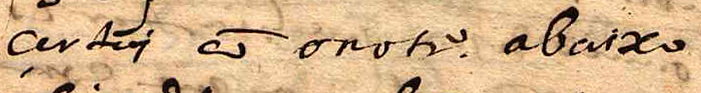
certey cō o notro. abaixo
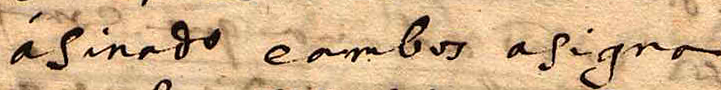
asinado e ambos asigna
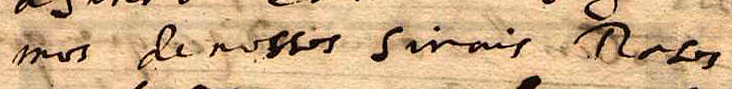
mos de nossos sinais Rasos
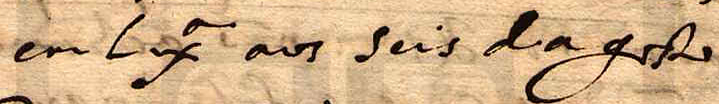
em Lixa aos seis dagosto
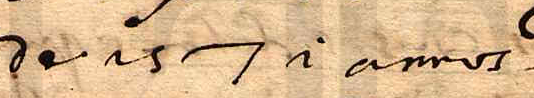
de 157i annos
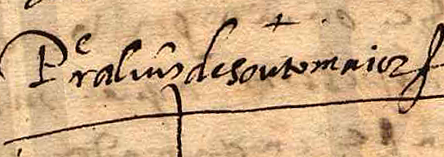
Proalur̄z de soutomaior
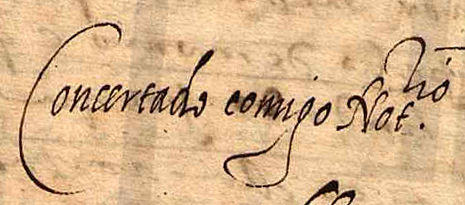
Concertado comigo Not.rio
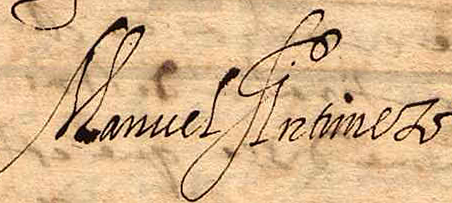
Manuel Antunez.
